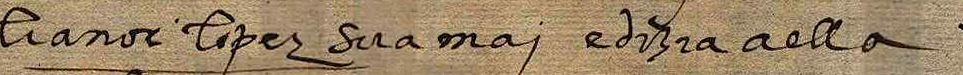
lianor lopez sua maj e dizia a ella
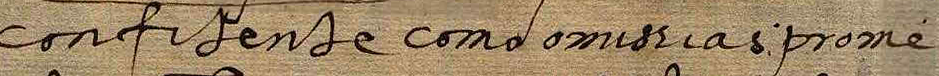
confitente como o missias prome
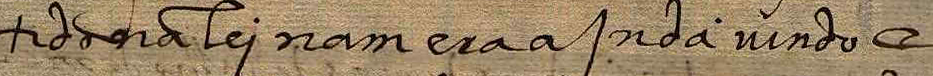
tido na lej nam era aJnda uindo e
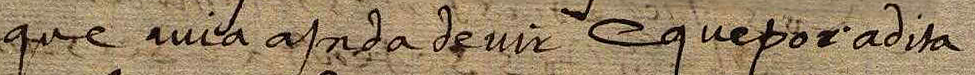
que auia aJnda de uir e que por a dita
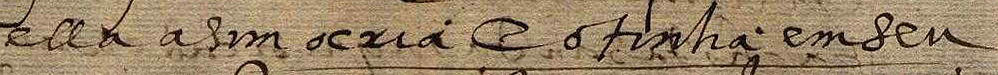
ella asim o cria e o tinha em seu
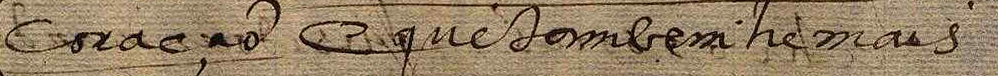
coraçaõ e que tambem he mais
